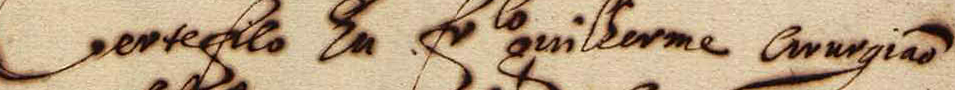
Certefico Eu frco guilherme cirurgião
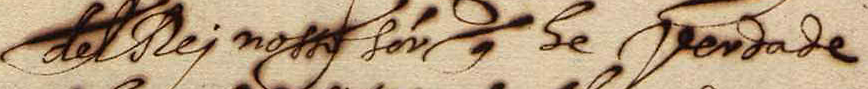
del Rej nosso sor̄ q̄ he Verdade
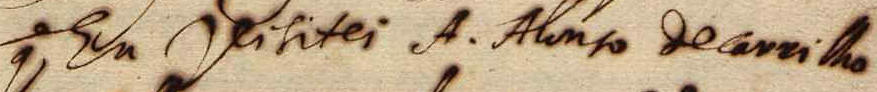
q̄ Eu Visitei A. Alonso de carrilho
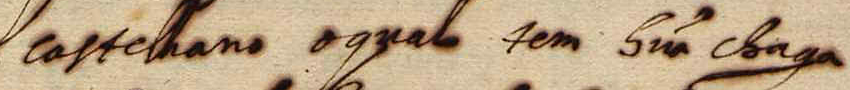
castelhano o qual tem huā chaga
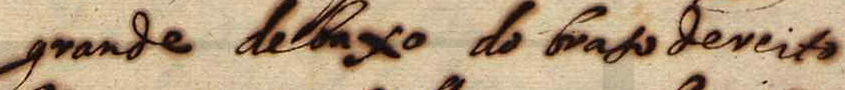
grande debaxo do braso dereito
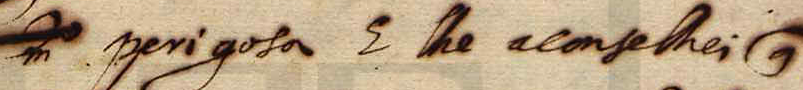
mto perigosa E lhe aconselhei q̄
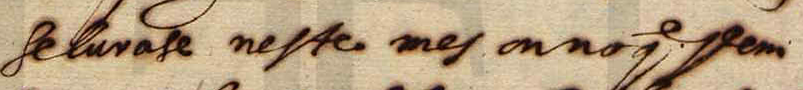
se curase neste mes ou no q̄ Vem
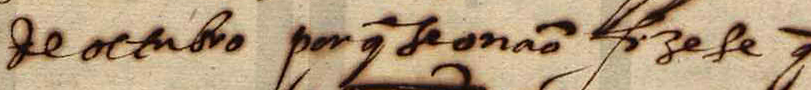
de octubro porq̄ se o naõ fizese q̄
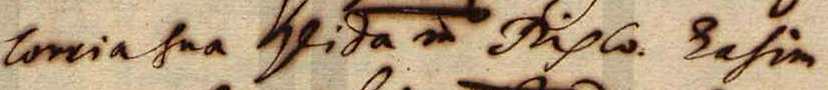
corria sua Vida mto Risco. E asim
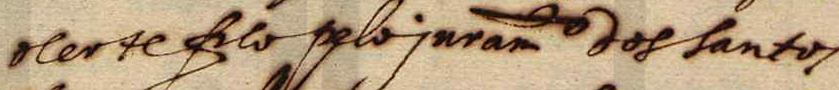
o certefico pelo juramto dos santos
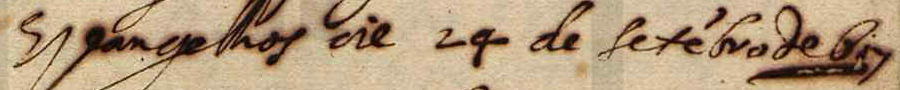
EVangelhos oie 24 de setēbro de 617
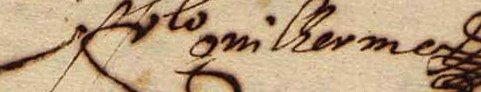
frco guilherme
